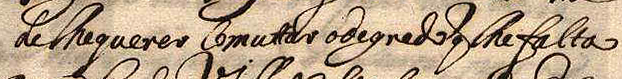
de lhe querer comuttar o degredo q̄ lhe falta
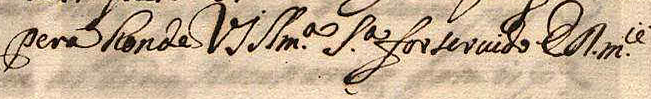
pera honde V Illm.a S.a for seruido E R. m.ce
